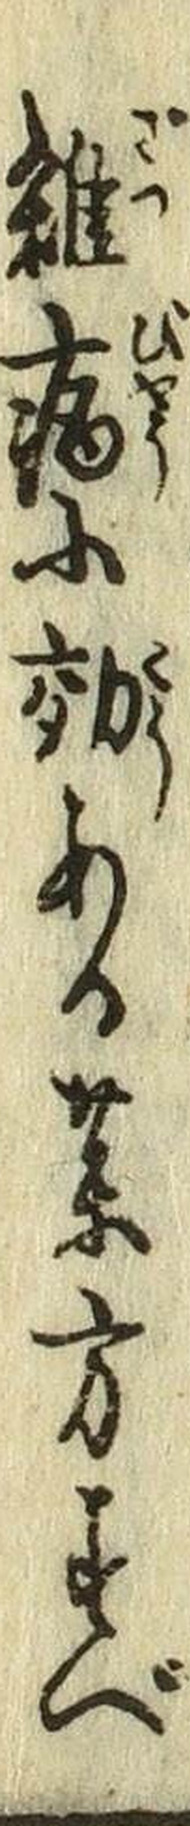雑病に効ある薬方すべ
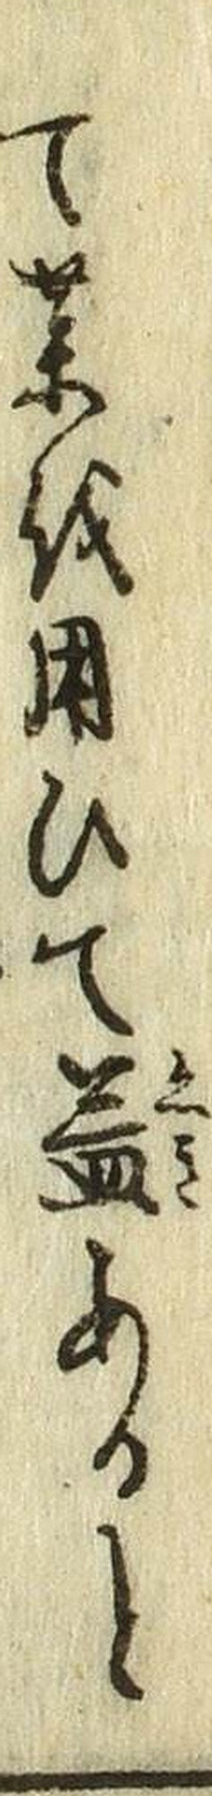て薬を用ひて益あると
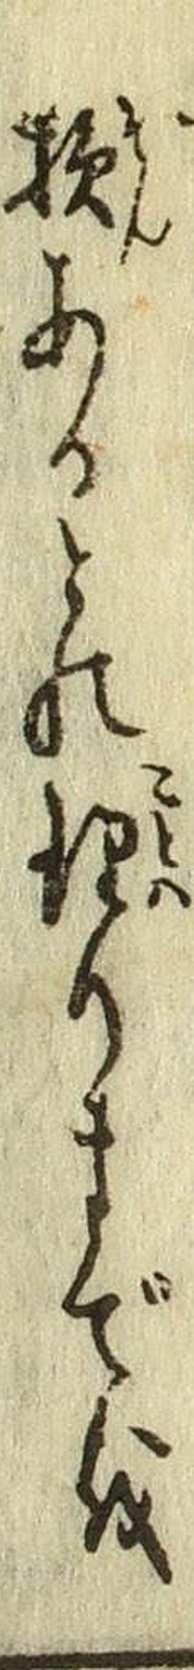損あるとの理りまでを
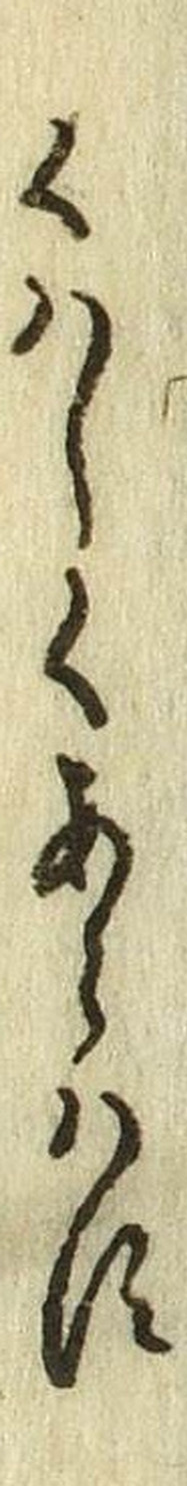くはしくあらはす

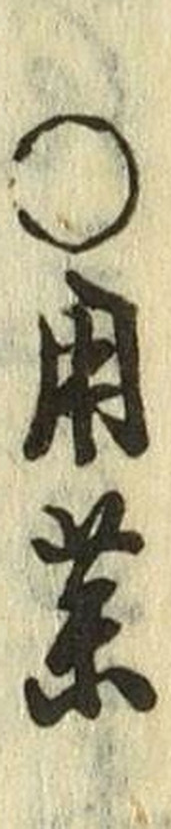○用薬
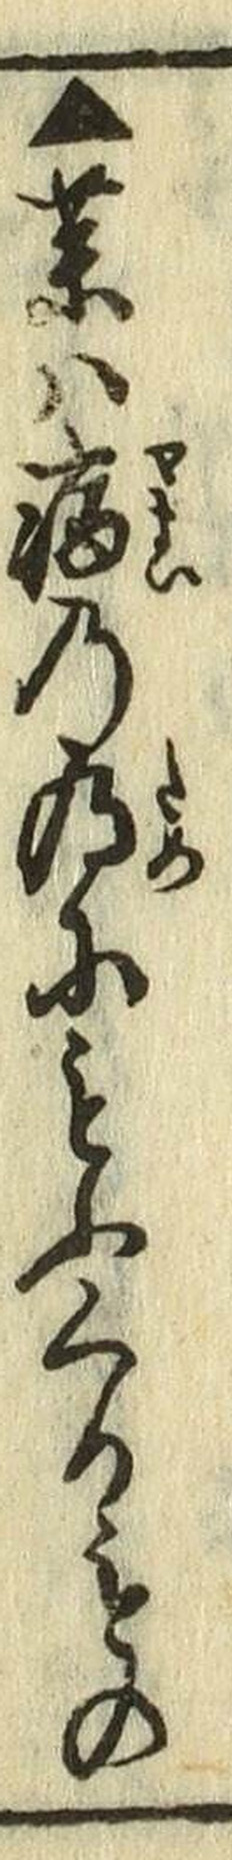▲薬は病の為にもふくるもの
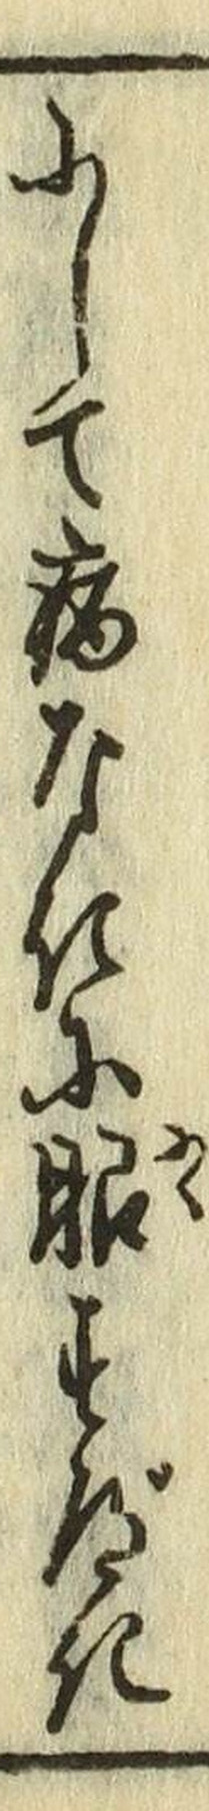にして病なきに服すべき
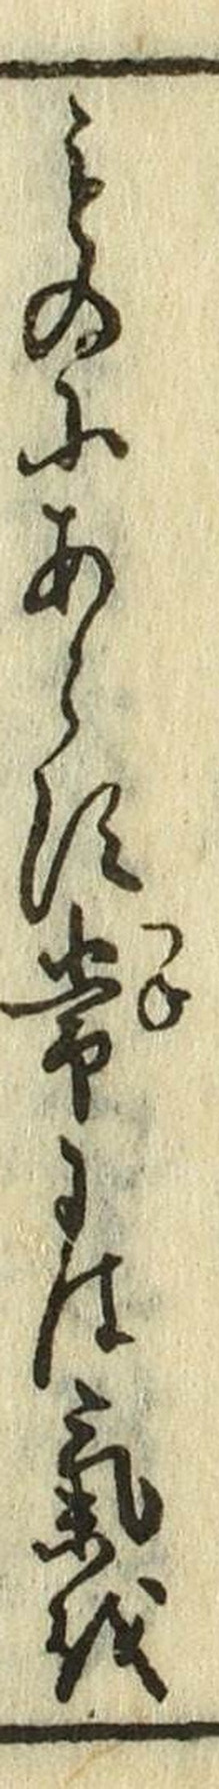ものにあらす常には気を
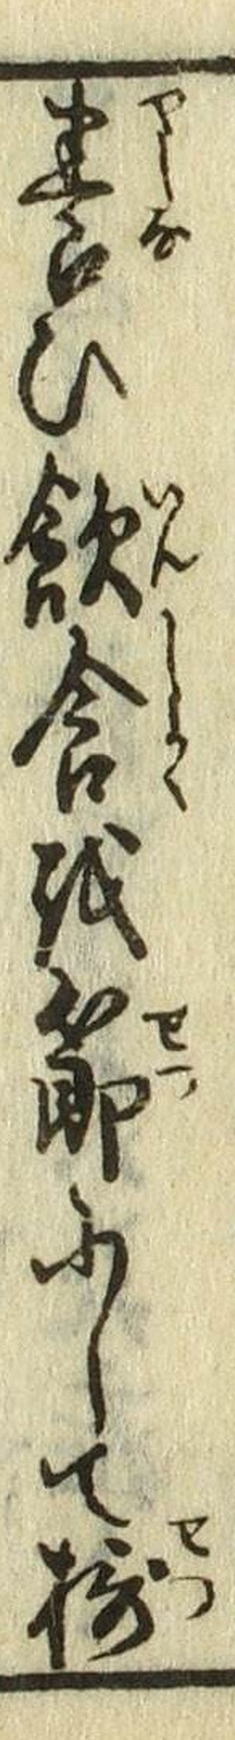養ひ飲食を節にして摂
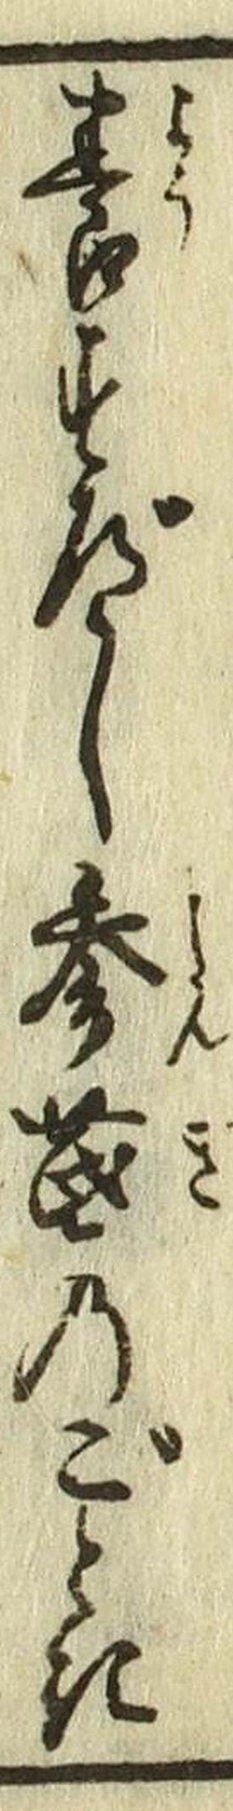養すべし参茋のごとき
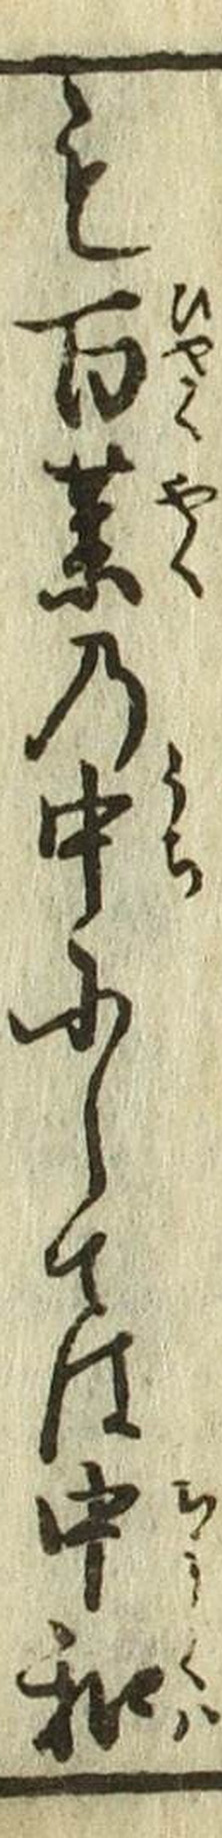も百薬の中にしては中和
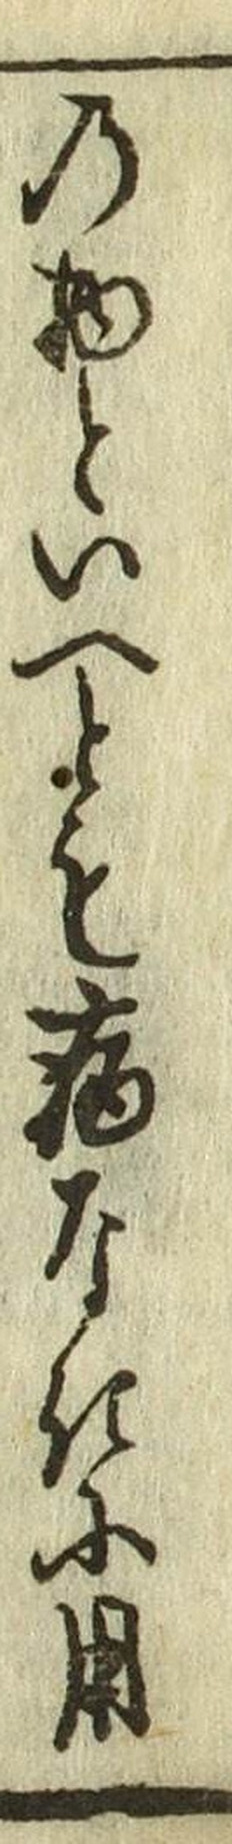の物といへとも病なきに用
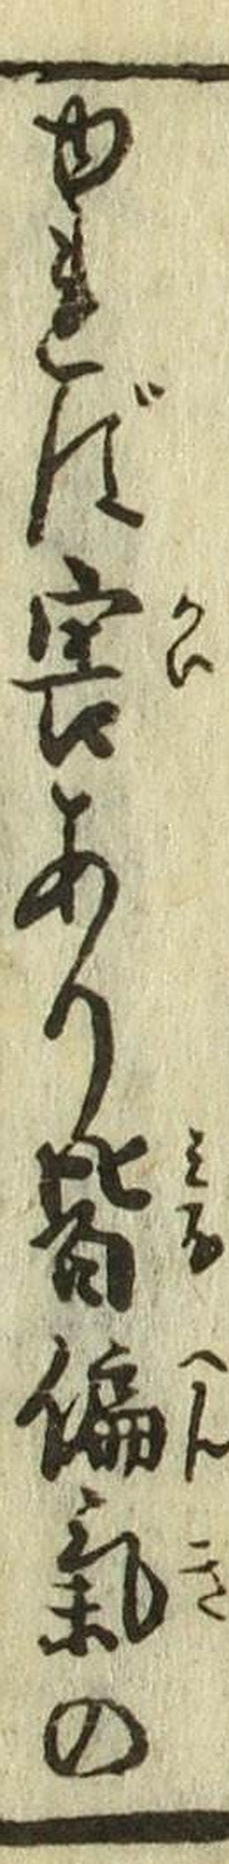ゆれば害あり皆偏気の
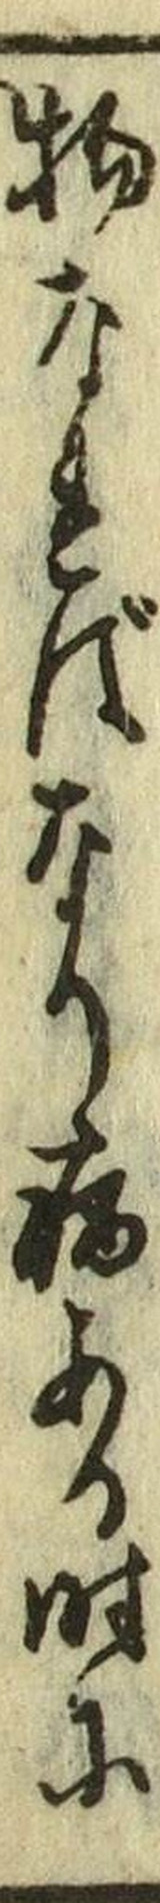物なればなり病ある時に

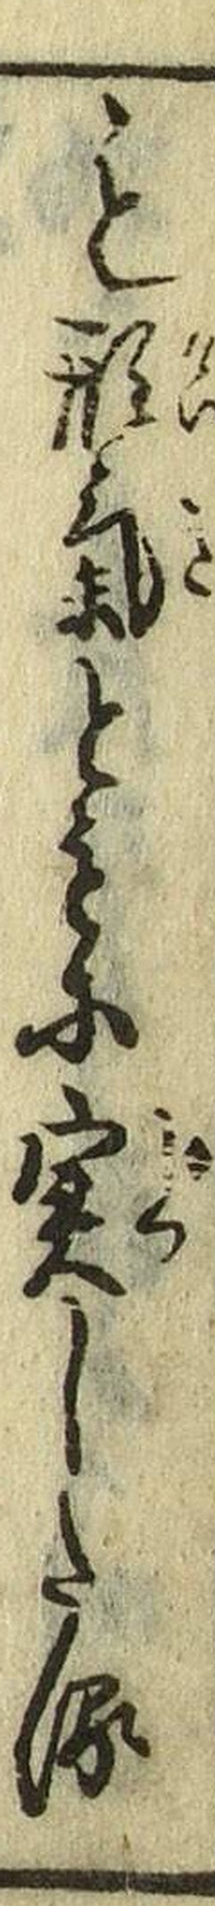も形気ともに実したる
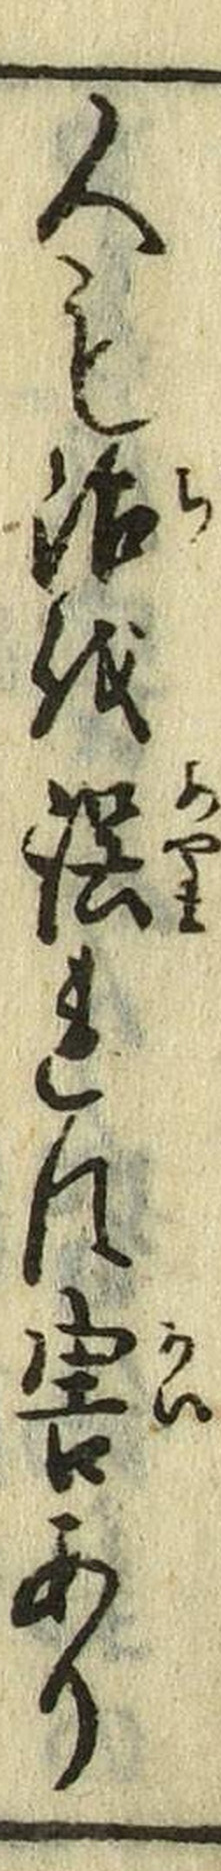人も治を誤れは害あり
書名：居家養生記
